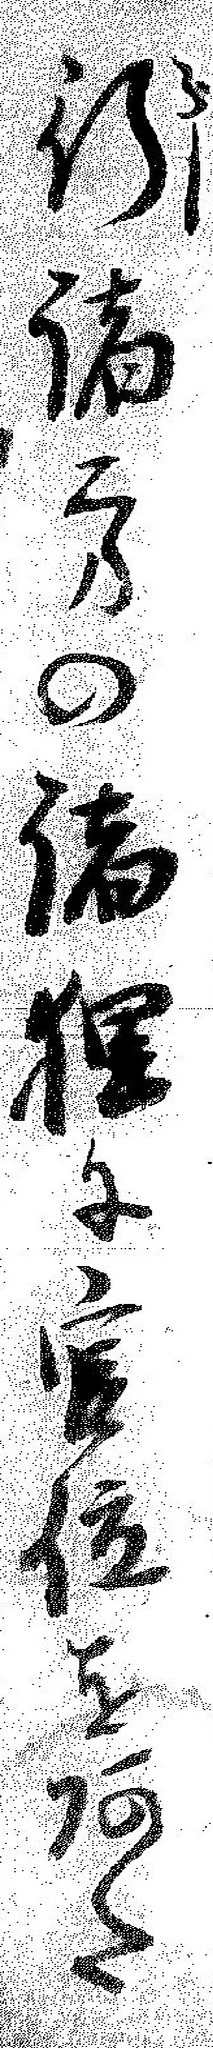行諸方の諸狸に官位をあた

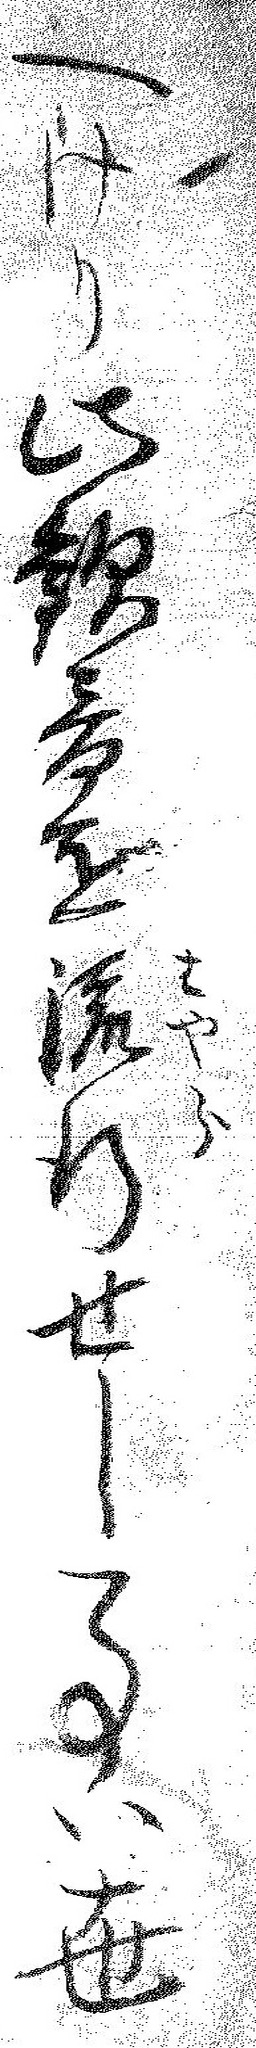へけり此観音を流行せし事は世
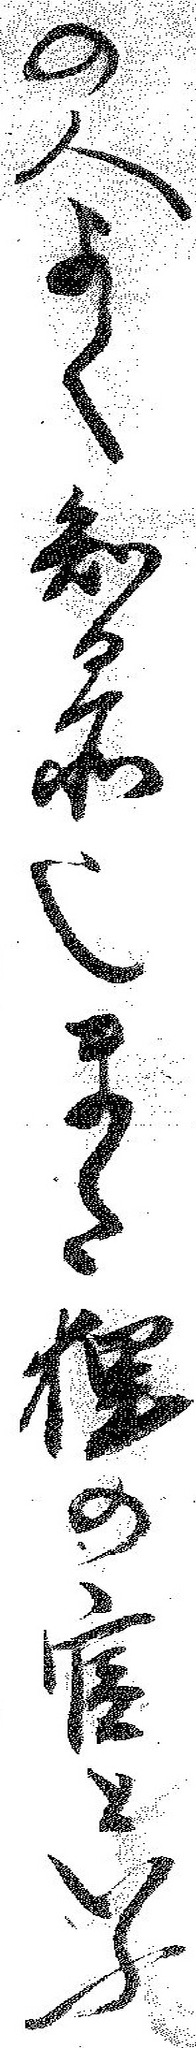の人よく知る所也また狸の官といふ
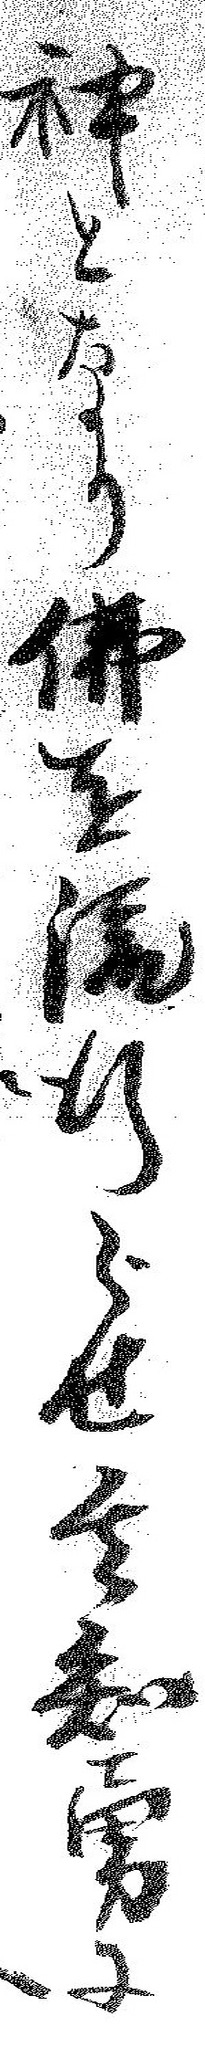神となり仏を流行らせ其知勇に
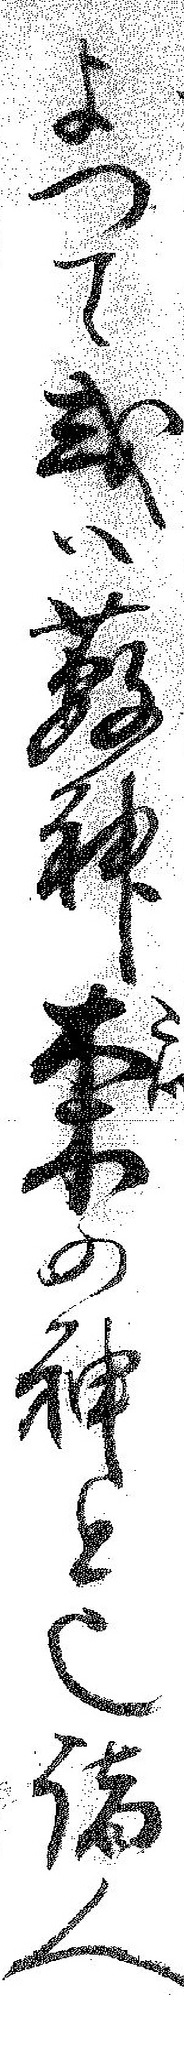よつて或は藪神大木の神と也諸人
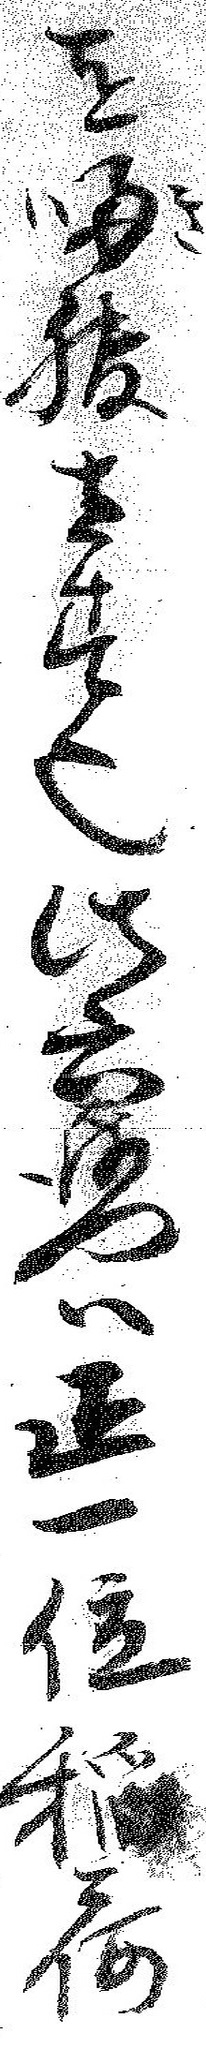を帰服さす也此六右衛門は正一位稲荷
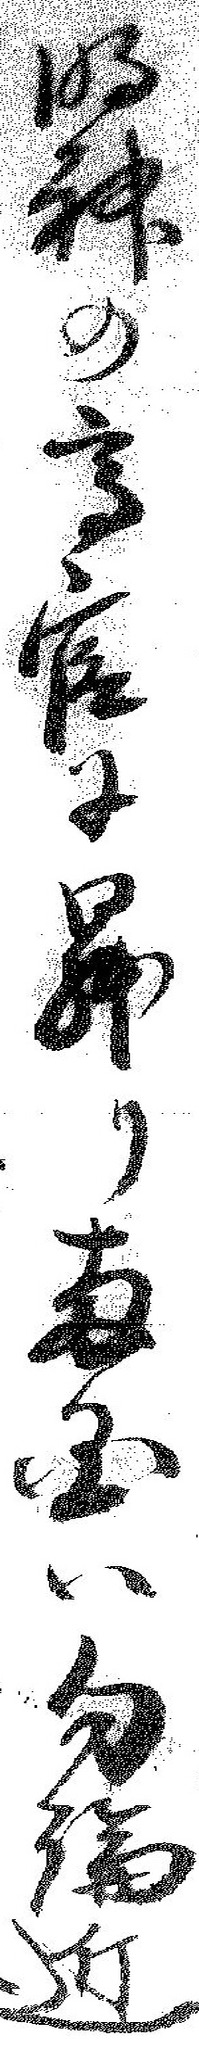明神の高官に昇り両国は勿論近
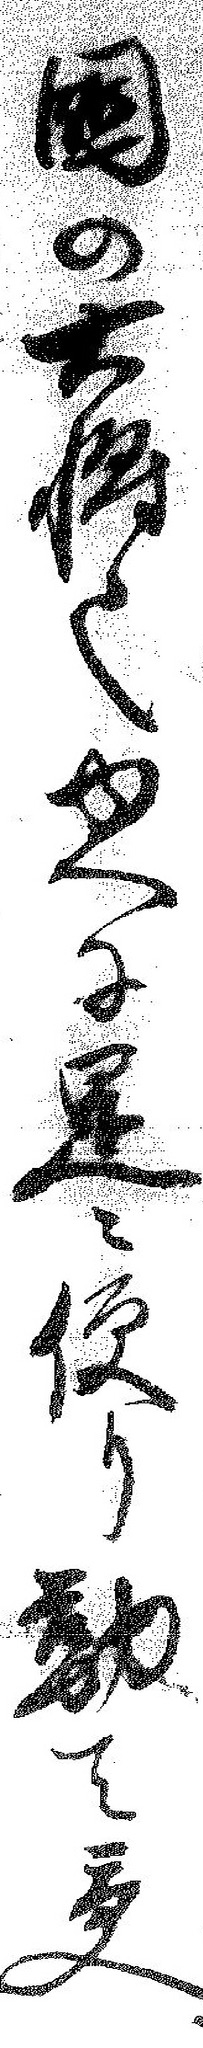国の大将也ゆへに是に便り勤て受
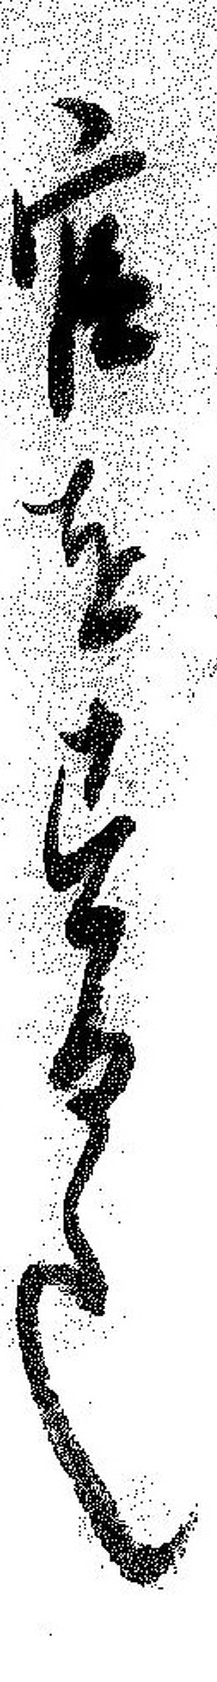官をする也
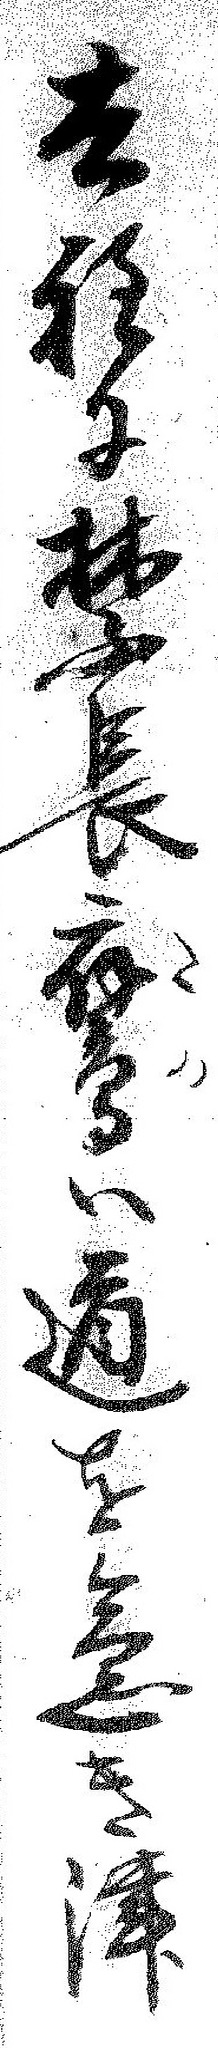去程に禁長鷹は道を急き津
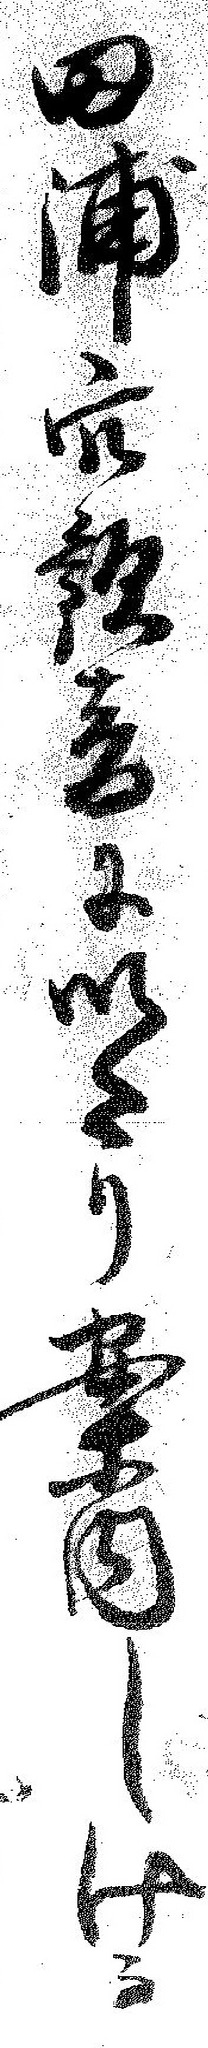田浦穴観音にいたり案内しける
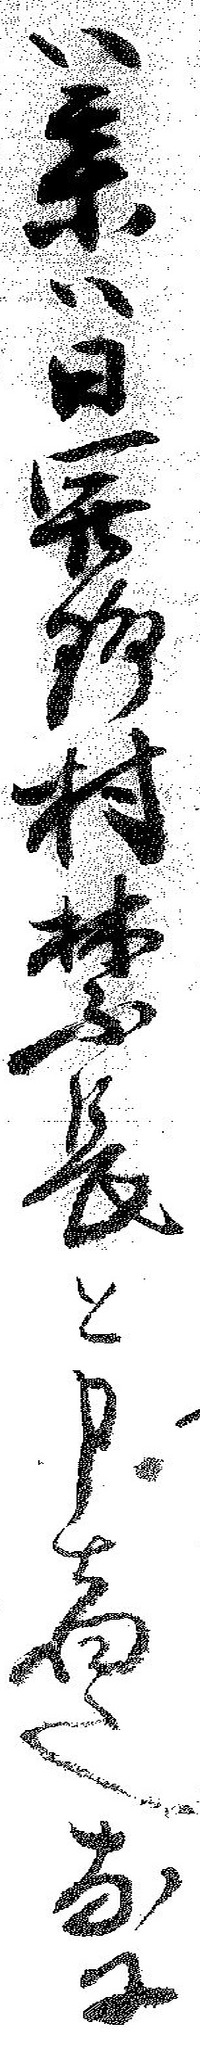は某は日開野村禁長と申者也なに
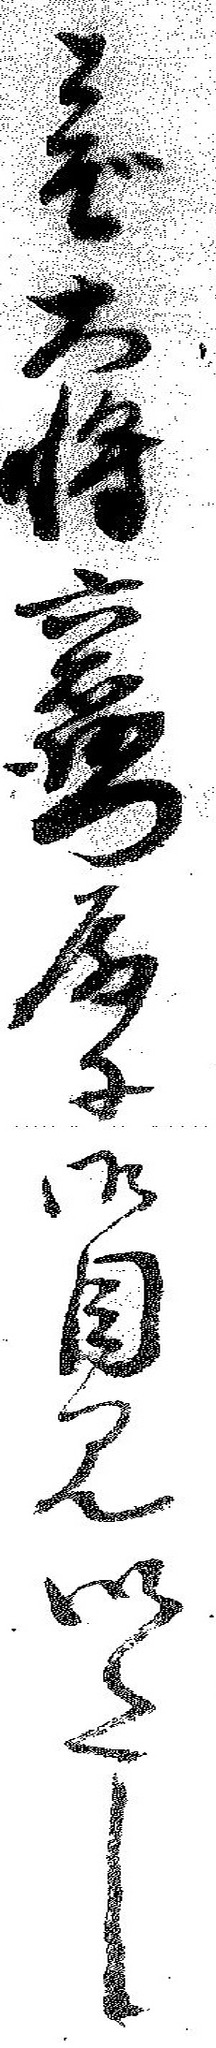とぞ大将六右衛門殿に御目見いたし
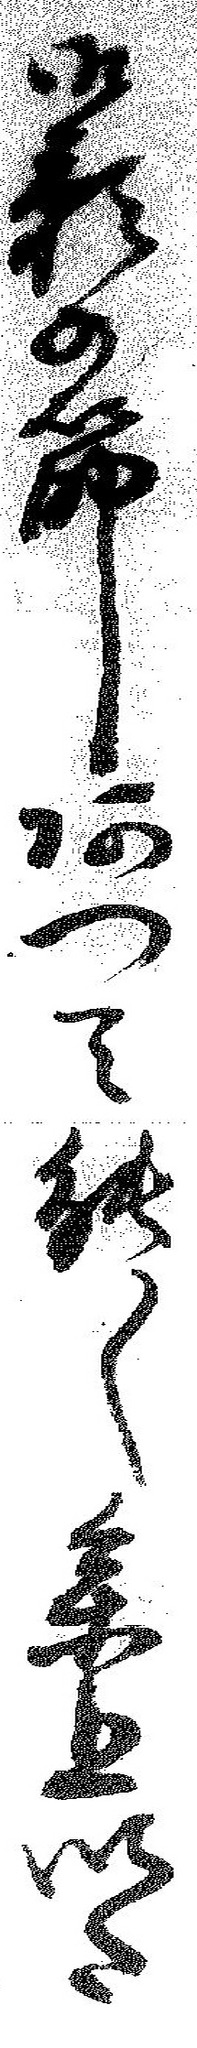御願の節あつて能〳〵参上いた
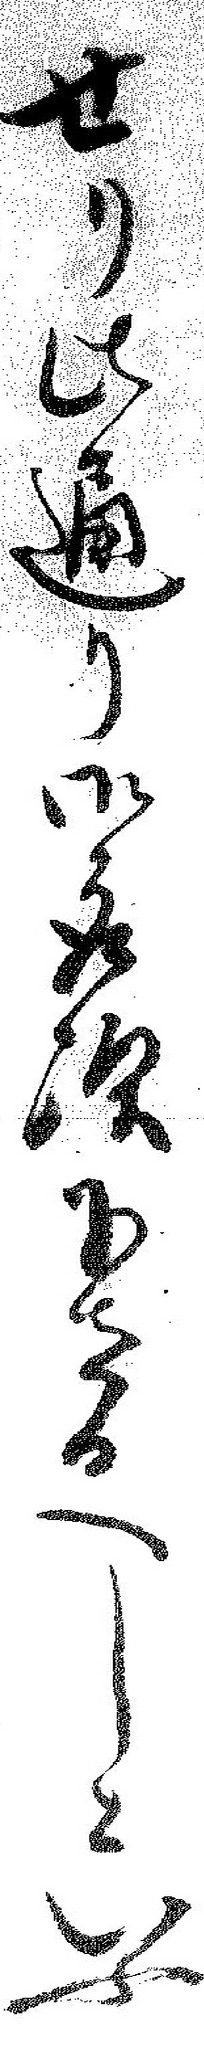せり此通り御取次下さるへしといふ
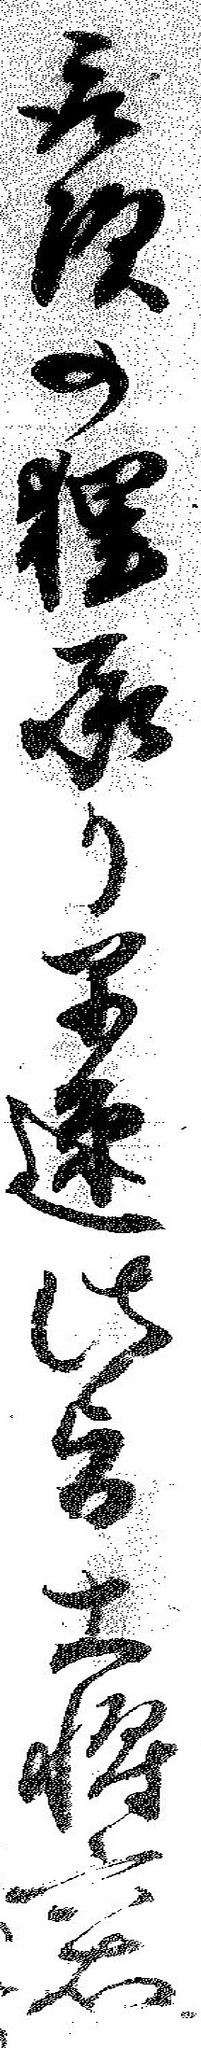取次の狸承り早速此旨大将六右
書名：近頃古狸珍説　礼義智信
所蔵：徳島県立図書館
